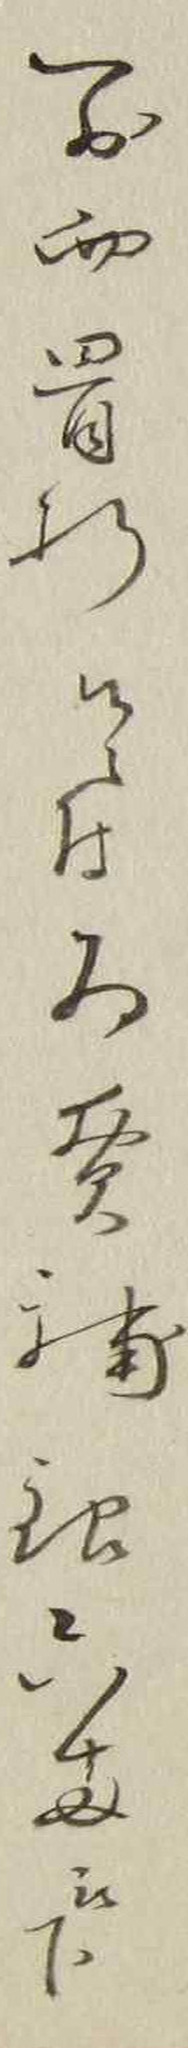別而骨折候ニ付為費補銀六両被下

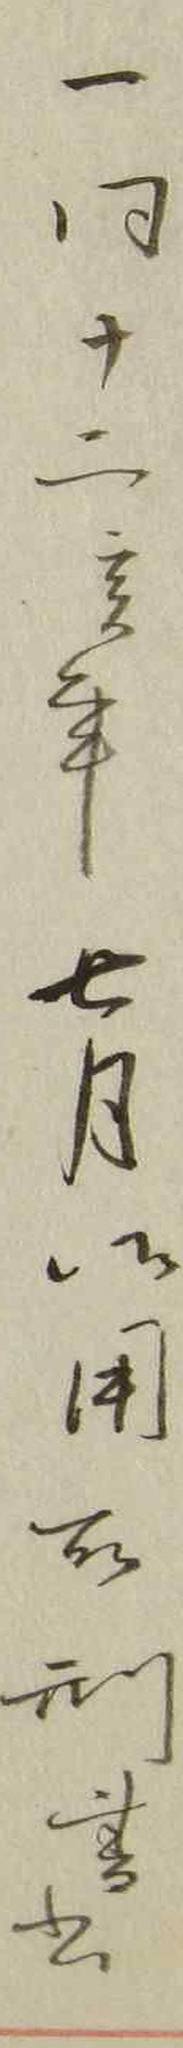一同十二亥年七月御用故刑書書
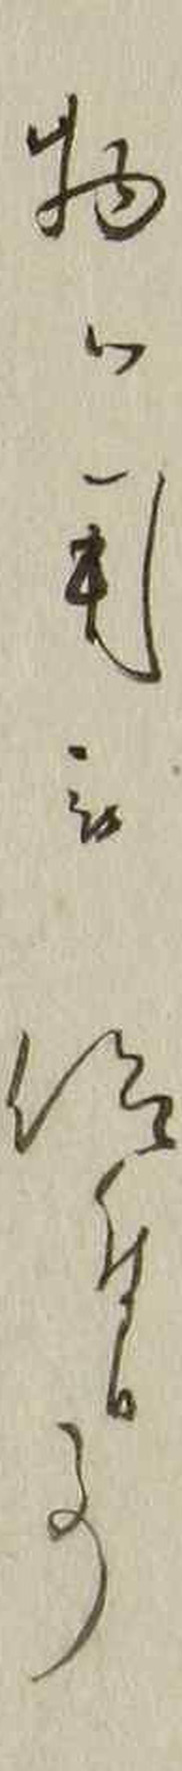物御用被仰付候事
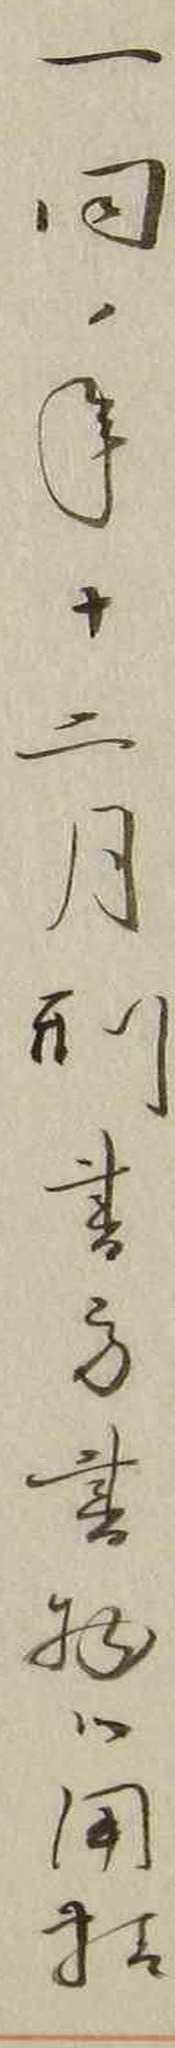一同年十二月刑書方書物御用精
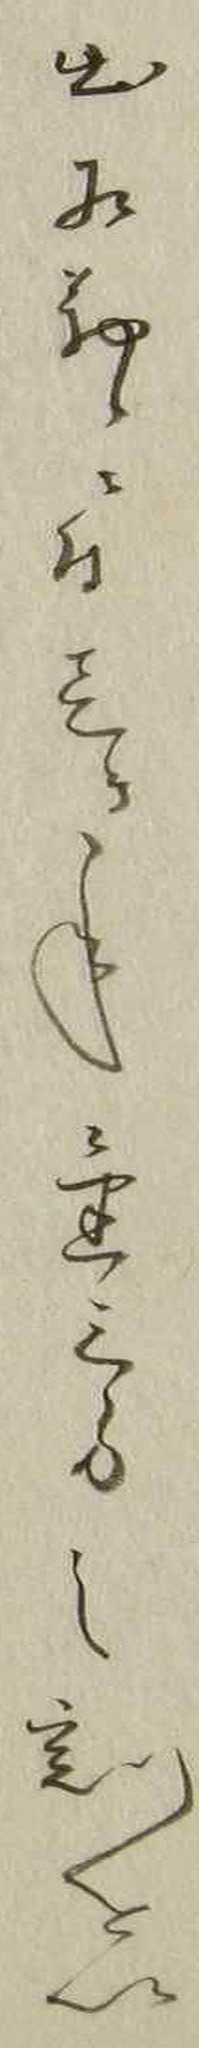出相勤候ニ付壱ケ年金三分之割を以
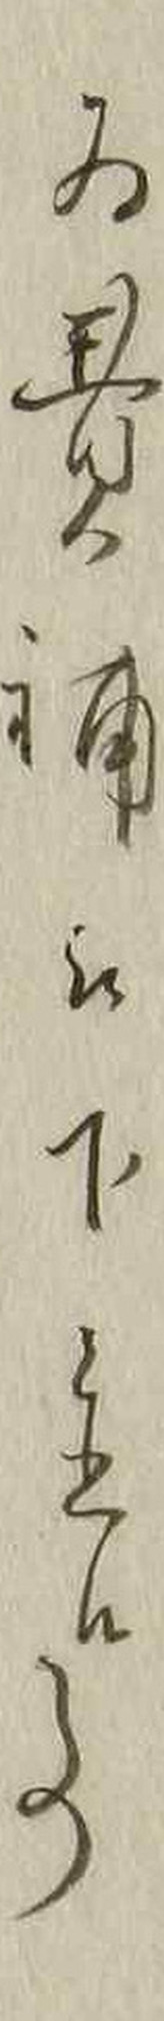為費補被下置候事
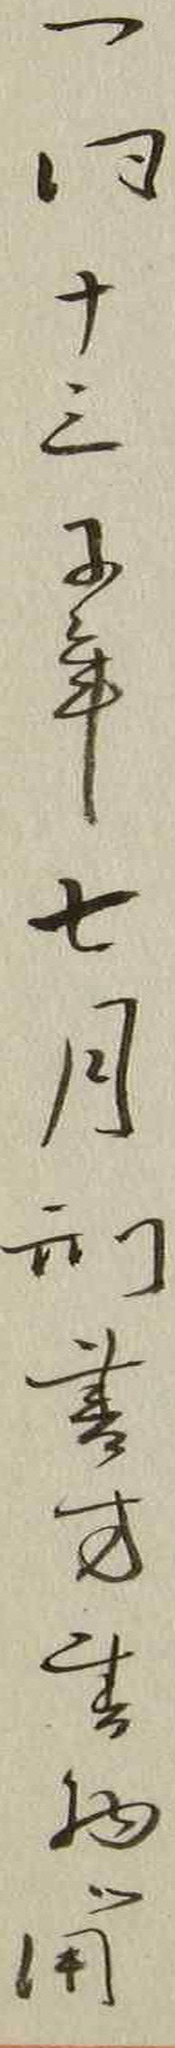一同十三子年七月刑書方書物御用
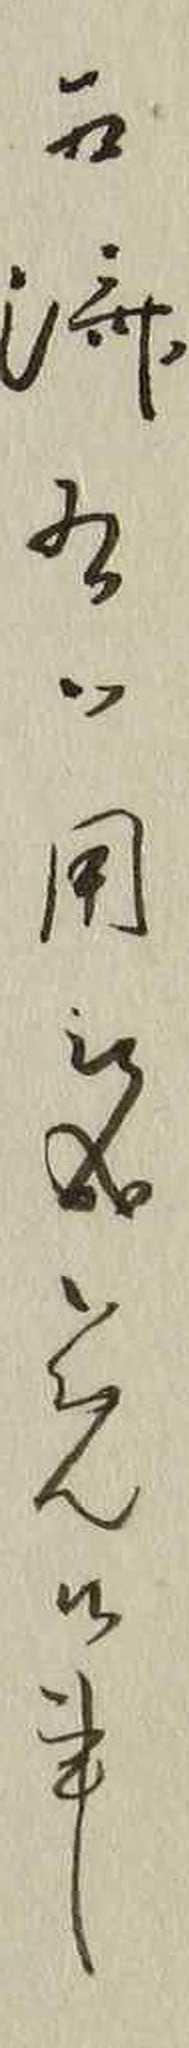相済右御用被成御免候事
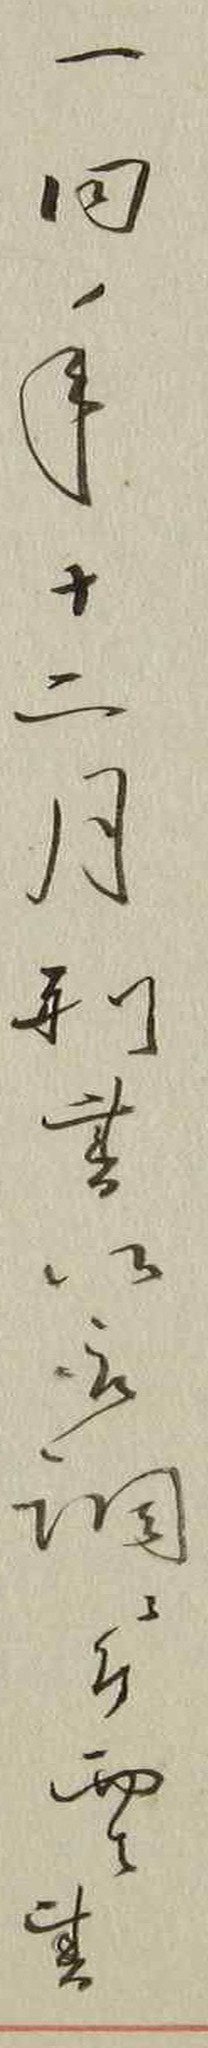一同年十二月刑書御取調ニ付而者書
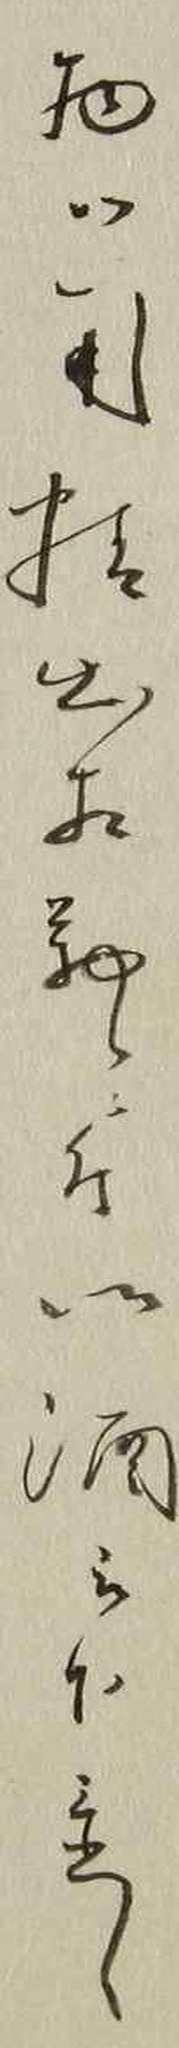物御用精出相勤候ニ付御酒被下置候
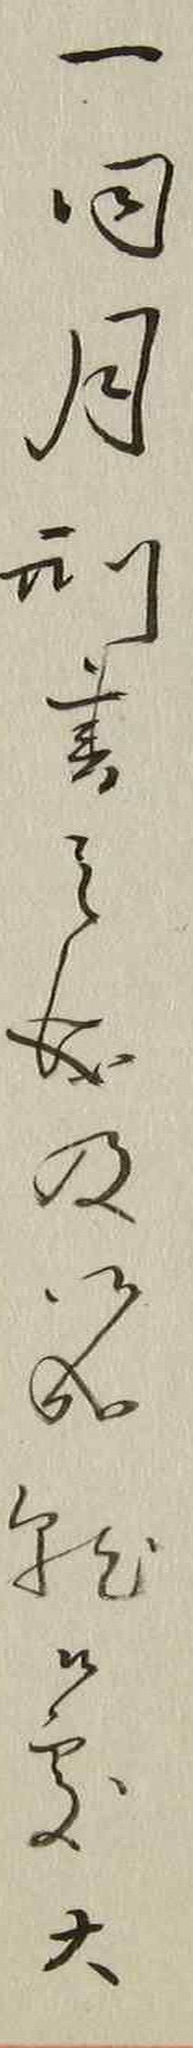一同月刑書之儀及御成就候処大
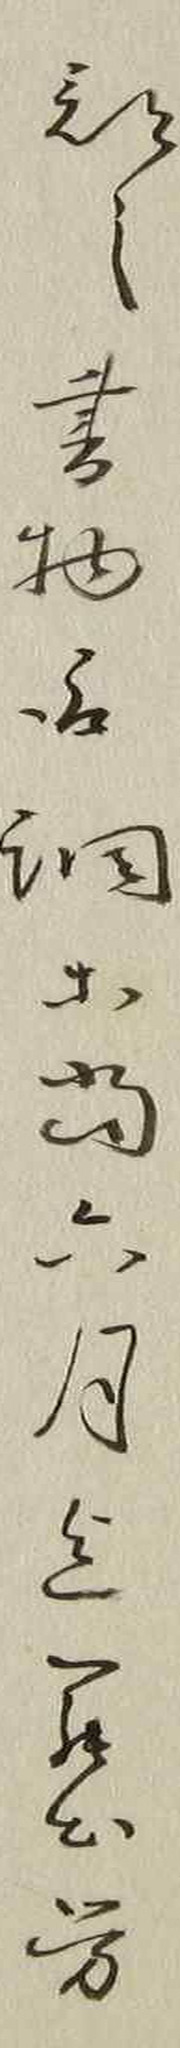部之書物取調等当六月迄罷出労
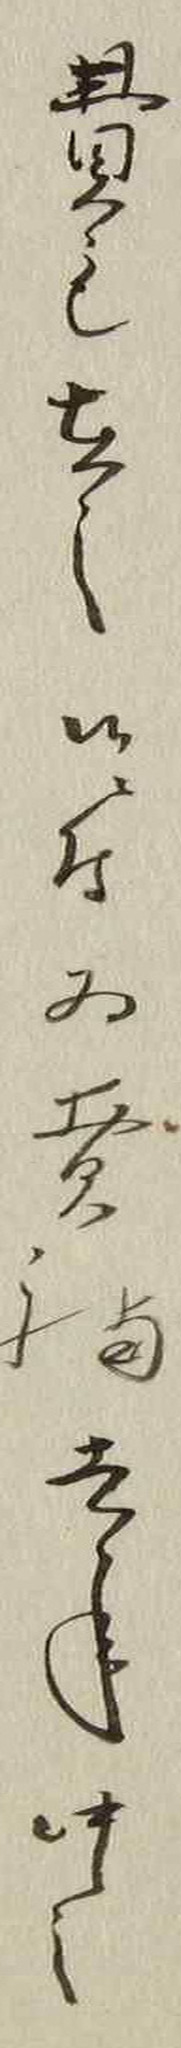費も在之候ニ付為費補去年中之
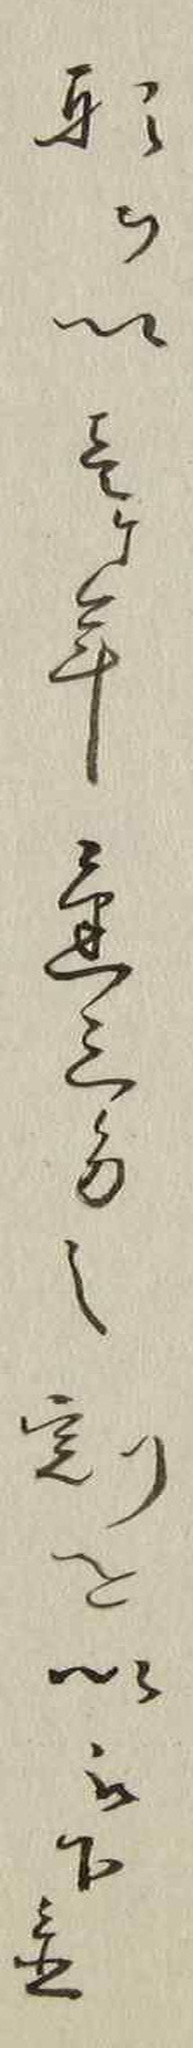形ヲ以壱ケ年金三分之割を以被下置
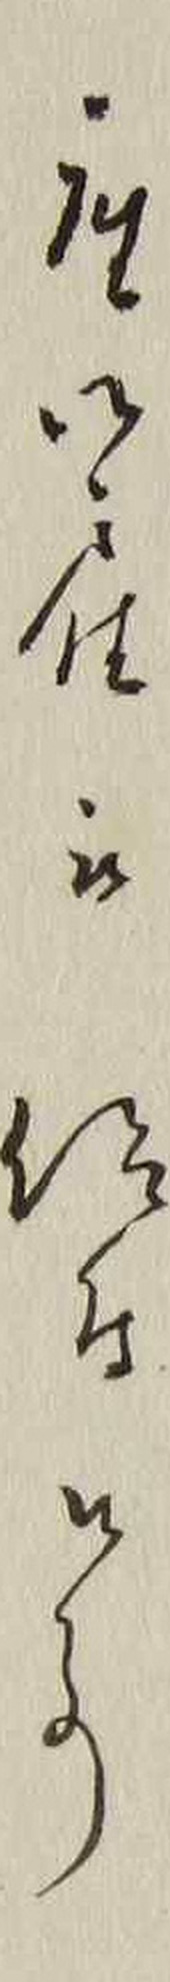座御雇被仰付候事
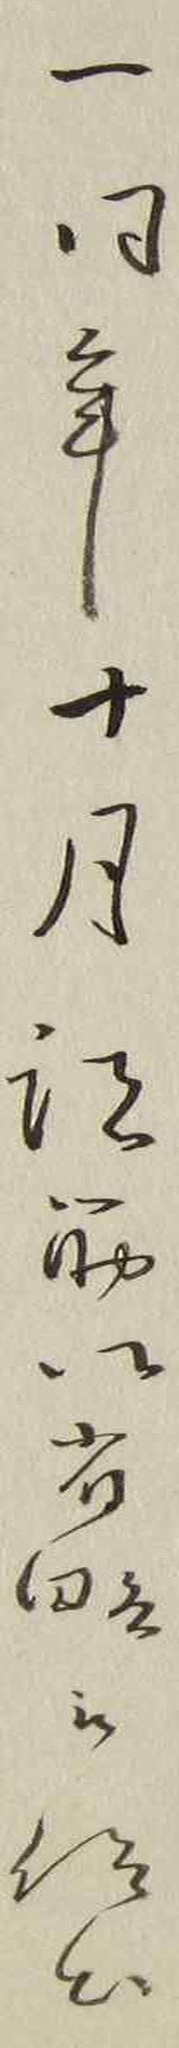一同年十月跡筋御省略被仰出
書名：諸士系譜　巻之8　い之部8
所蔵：会津若松市立会津図書館
